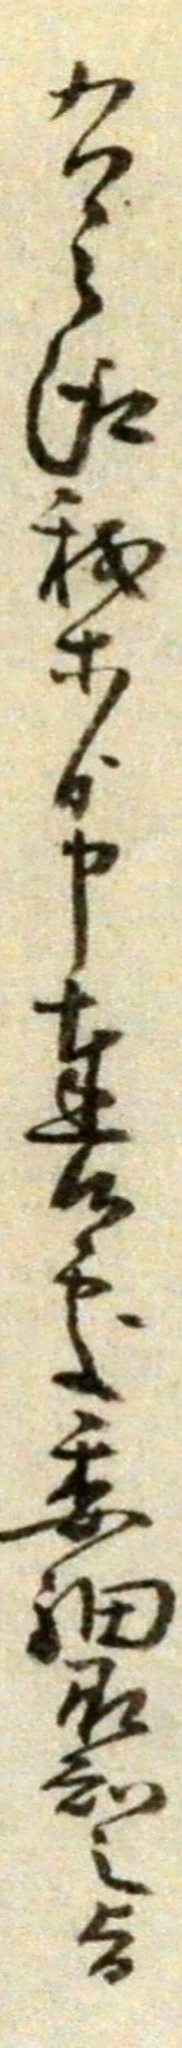右之趣我等ゟ申達候處委細承知之旨
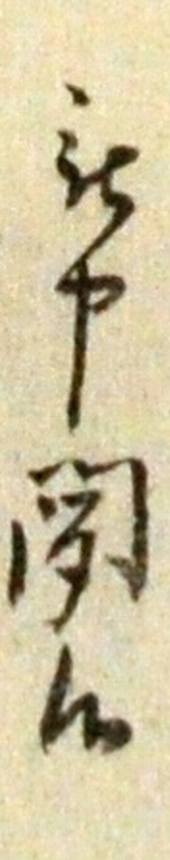被申聞候
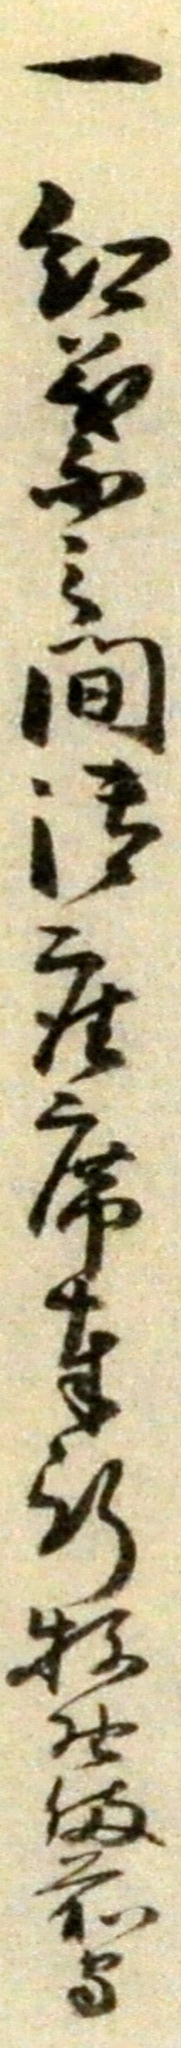一紅葉之間御座席奉行牧野備前守
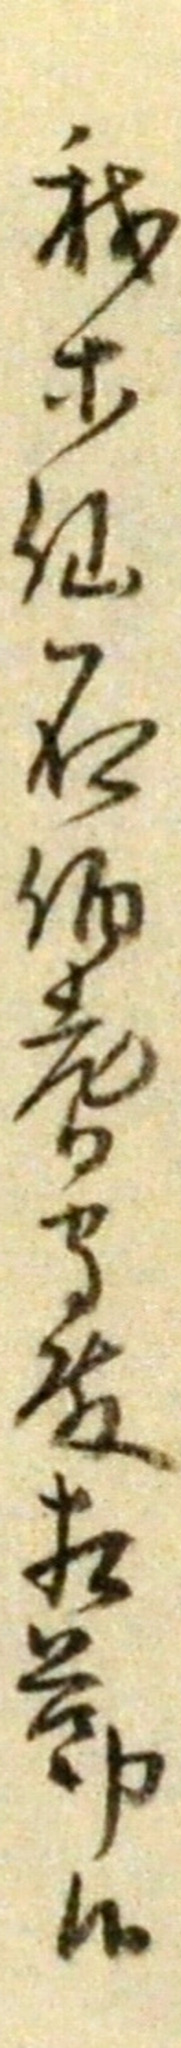我等仙石伯耆守殿相勤候
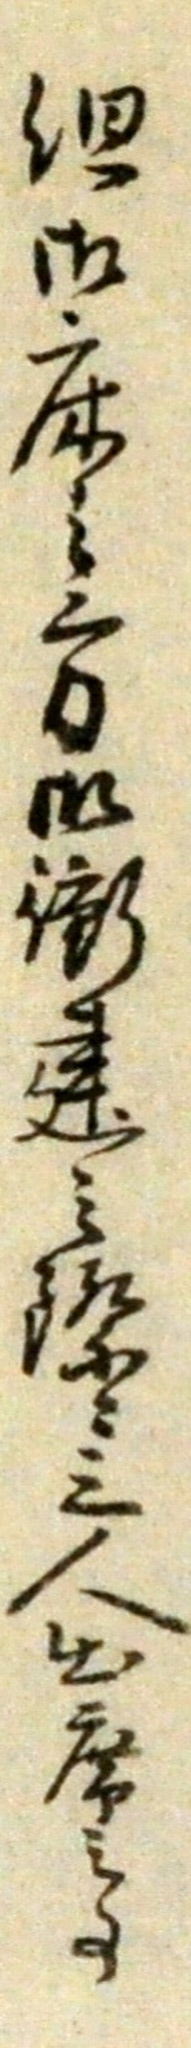但御床之方御衝建之際ニ三人出席之事
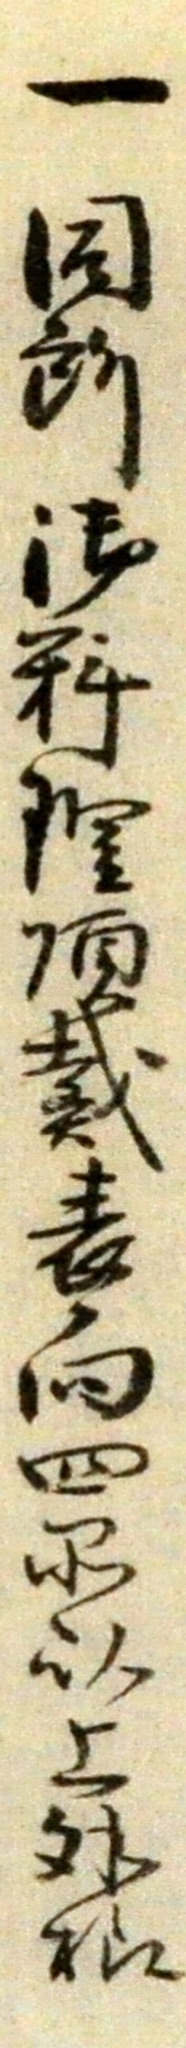一同所御料理頂戴表向四品以上外様
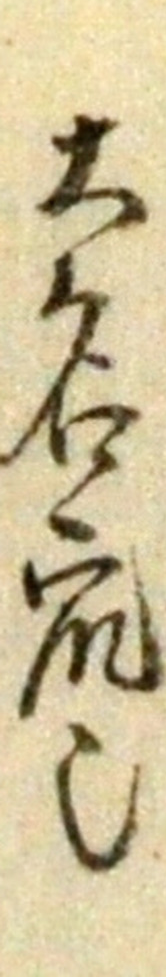大名衆也
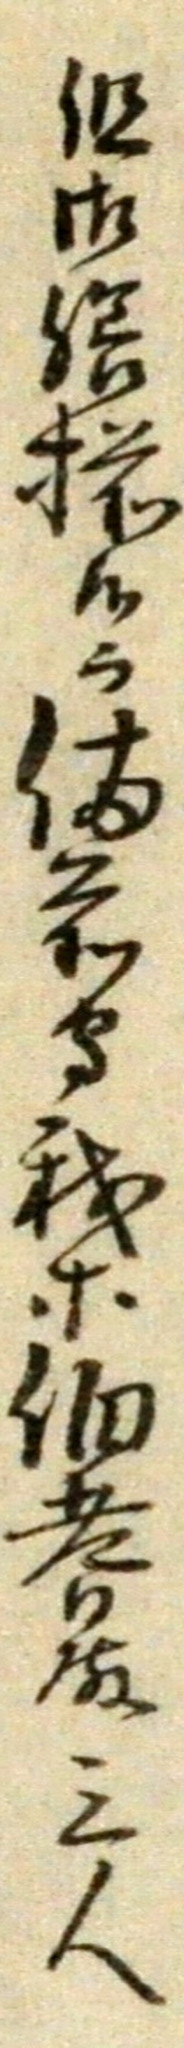但御膳揃候而備前守我等伯耆殿三人
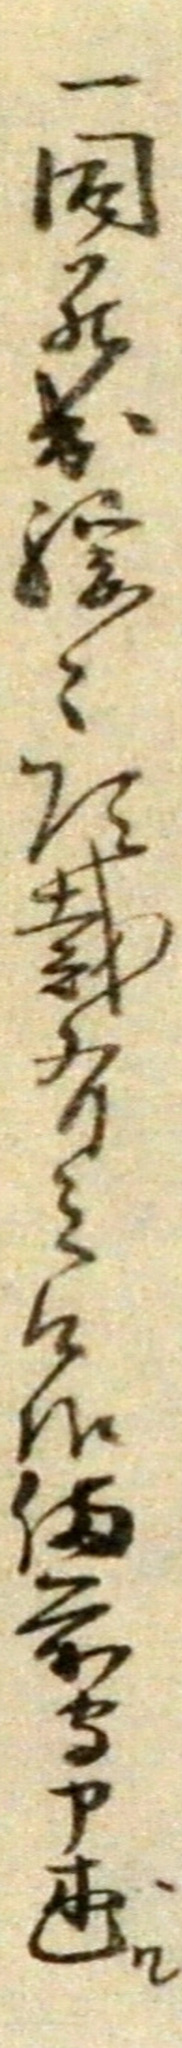一同罷出緩々頂戴有之候様備前守申述ル
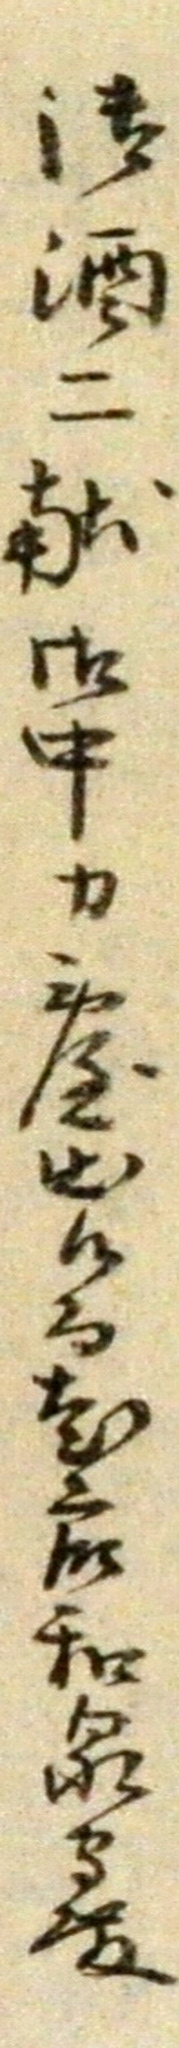御酒二献御中ヵ臺出候而老衆和泉守殿
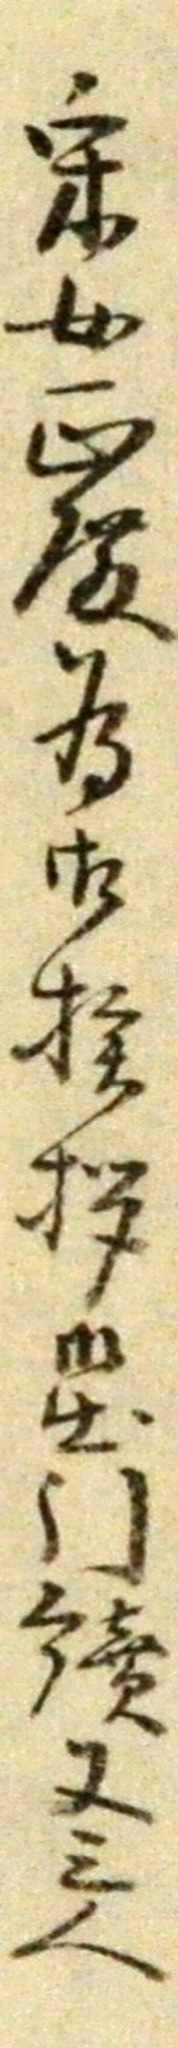采女正殿為御挨拶御出引続又三人
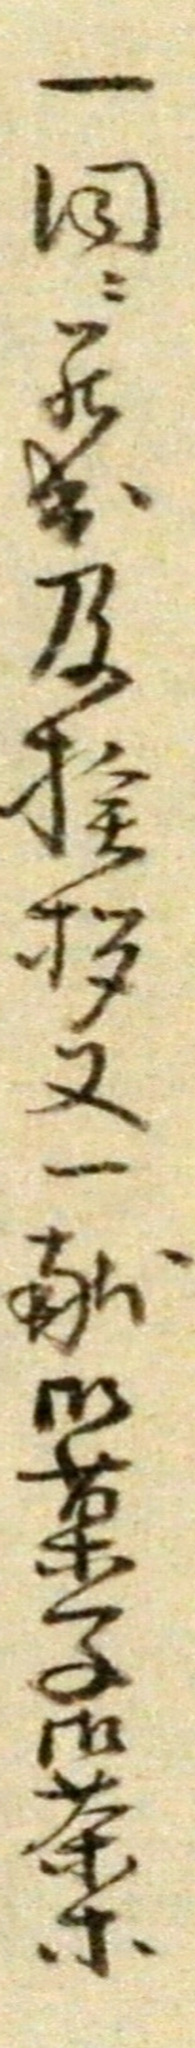一同ニ罷出及挨拶又一献御菓子御茶等
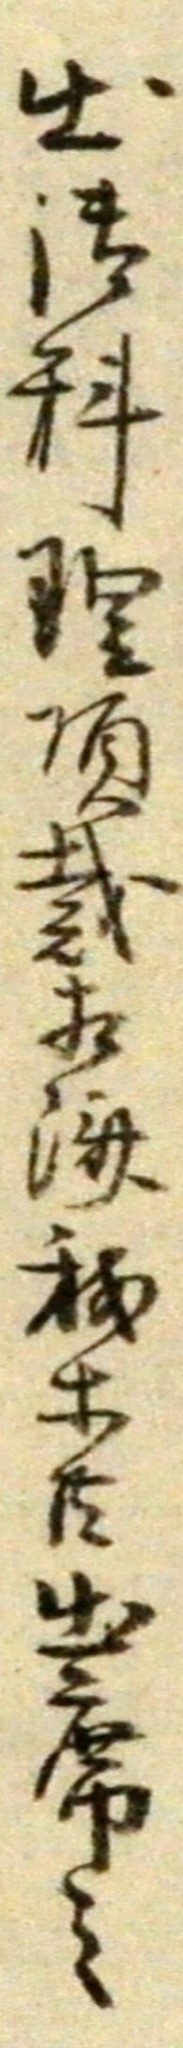出御料理頂戴相済我等共出席之
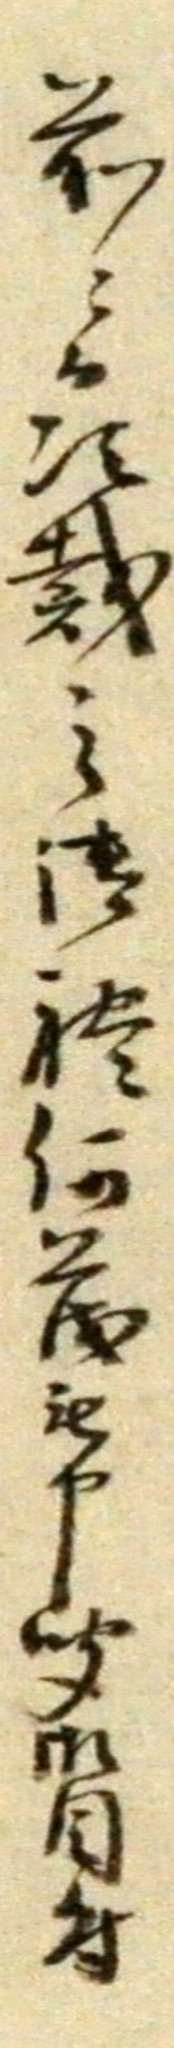前ニ而頂戴之御禮何も被申聞御目付
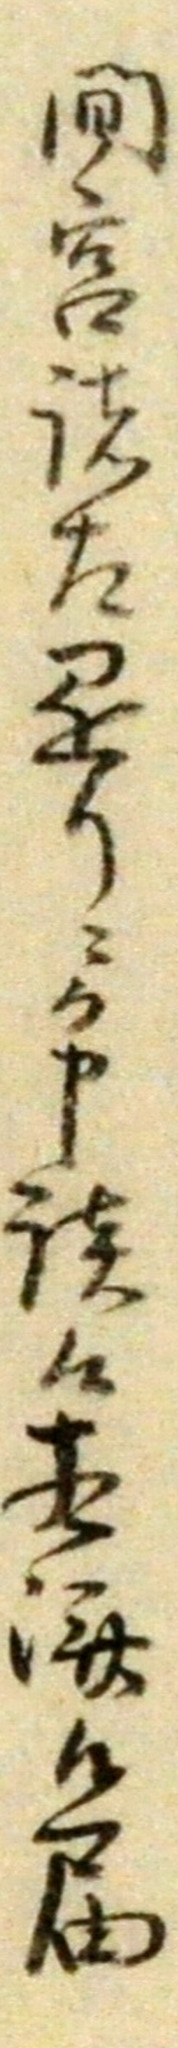間宮諸左懸りニ而申談候相済候届
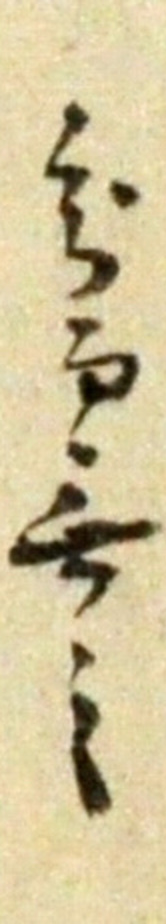分而無之
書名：若君様（家斉嫡男）誕生諸祝儀ノ節ノ留書外
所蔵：伊那市立高遠町図書館・合同会社AMANE
